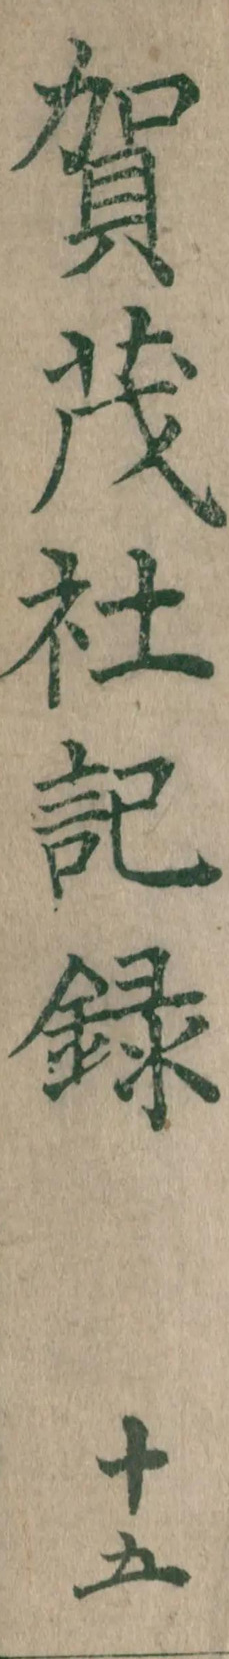賀茂社記録十五

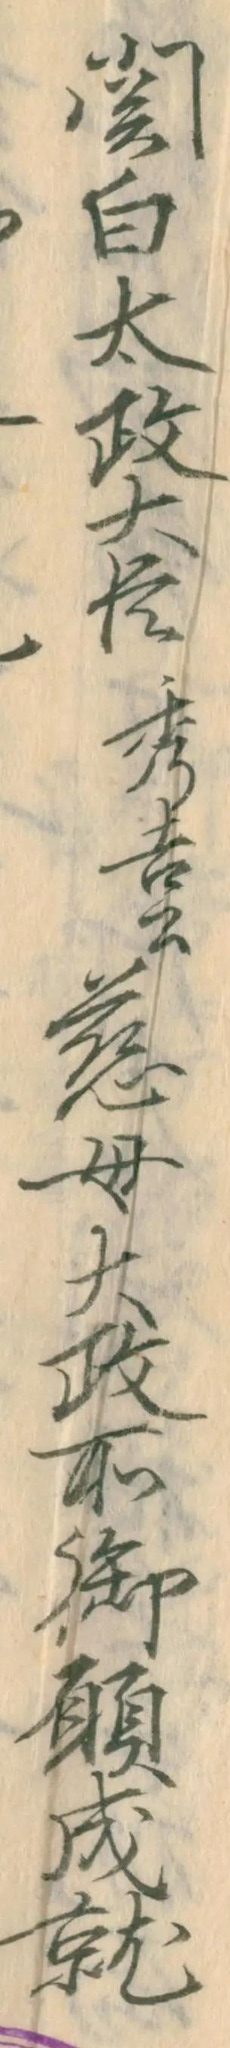関白太政大臣秀吉公慈母大政所御願成就
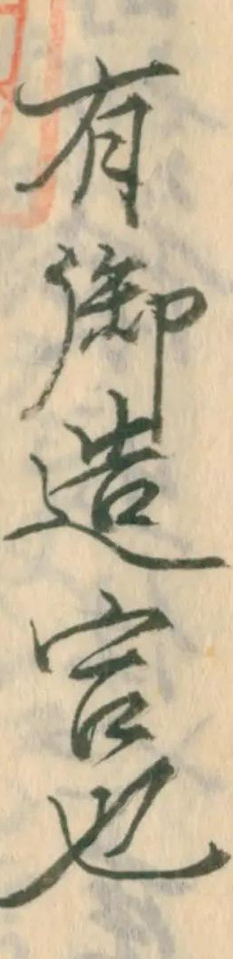有御造宮也
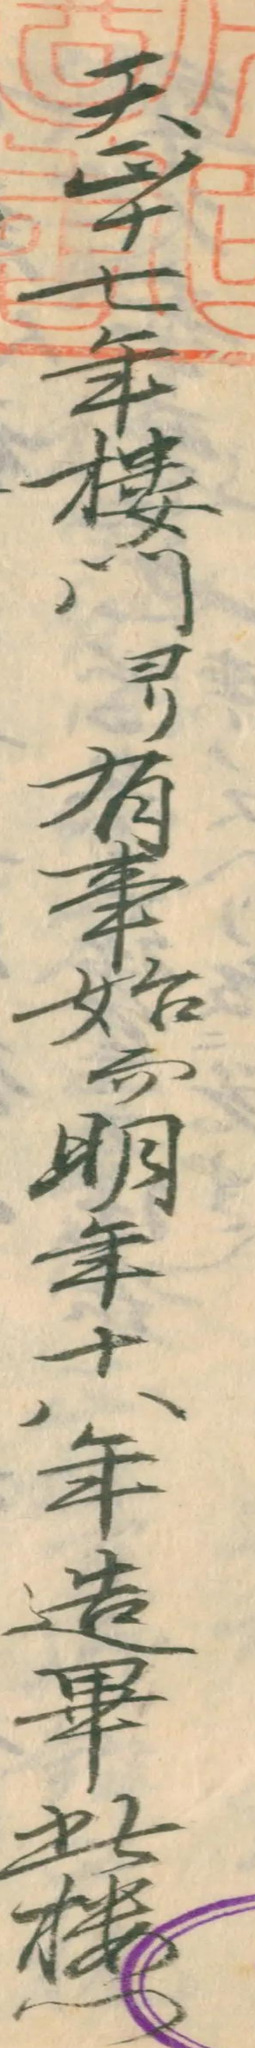一天正十七年楼門ヨリ有事始而明年十八年造畢此楼門
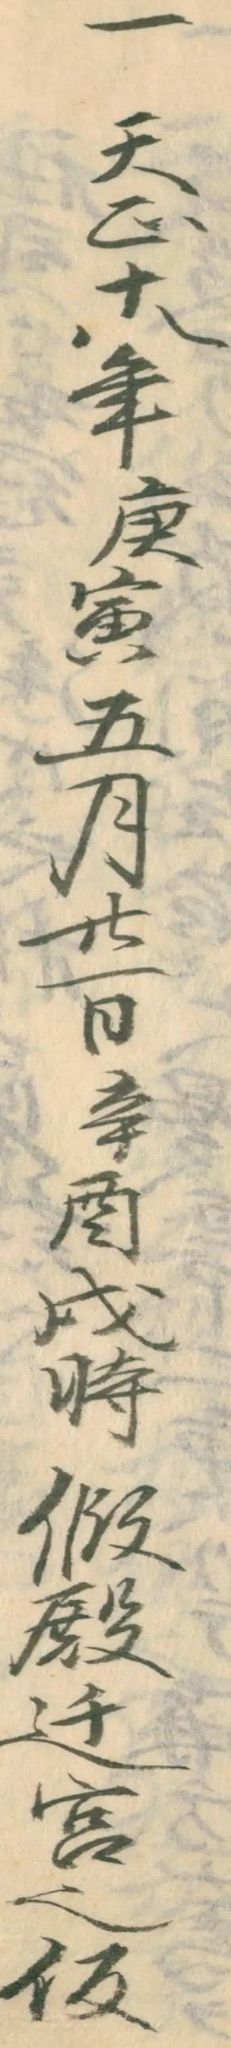一天正十八年庚寅五月廿一日辛酉戌時仮殿迁宮也仮
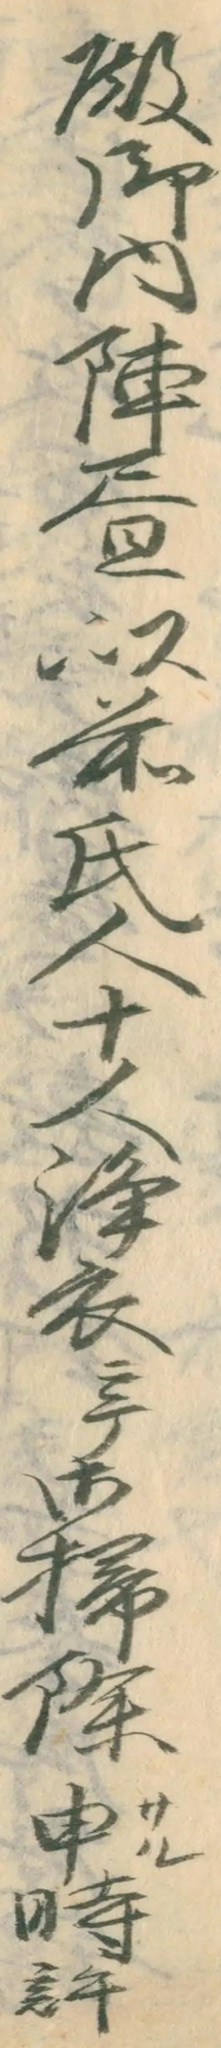殿御内陣昼以前氏人十人浄衣ニテ御掃除申時許

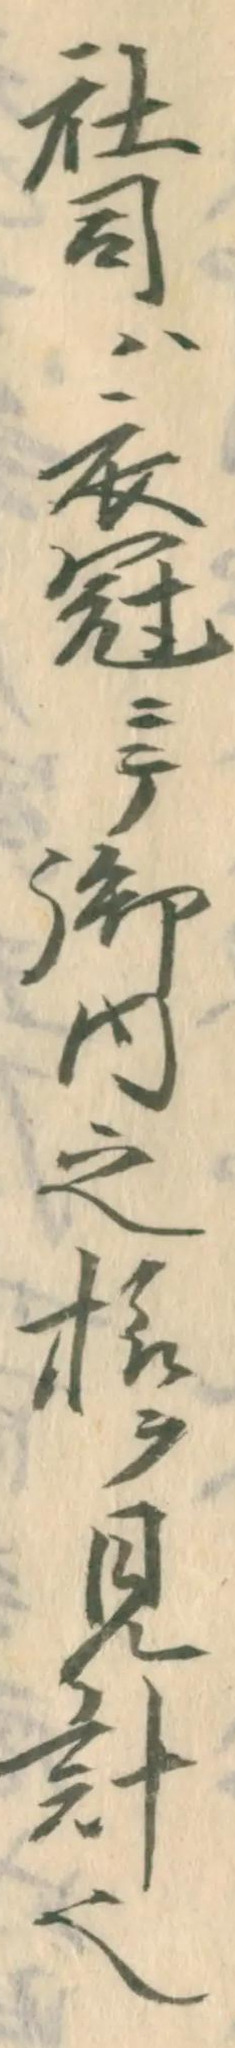社司ハ衣冠ニテ御内之様ヲ見計也
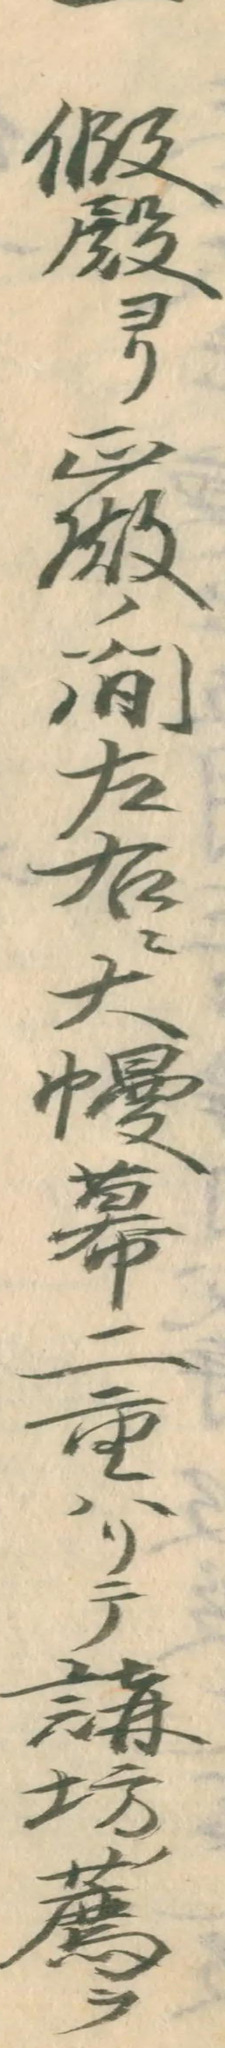一仮殿ヨリ正殿ノ間左右ニ大慢幕二重ハリテ講坊ノ薦ヲ
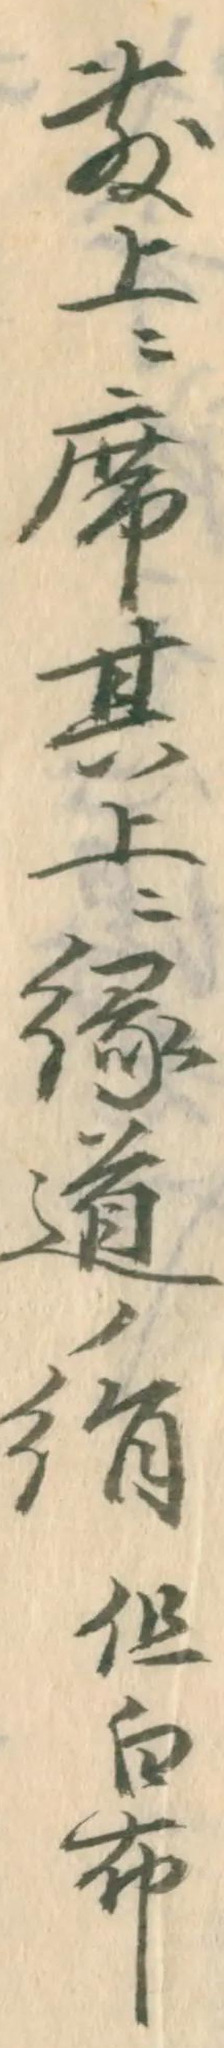敷上ニ席其上ニ縁道ノ絹但白布
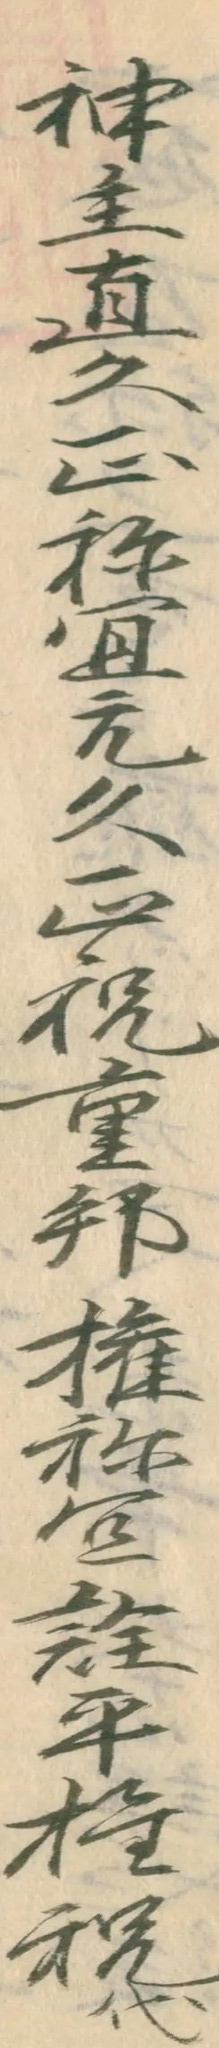一神主直久正祢宜元久正祝重邦権祢宜詮平権祝代
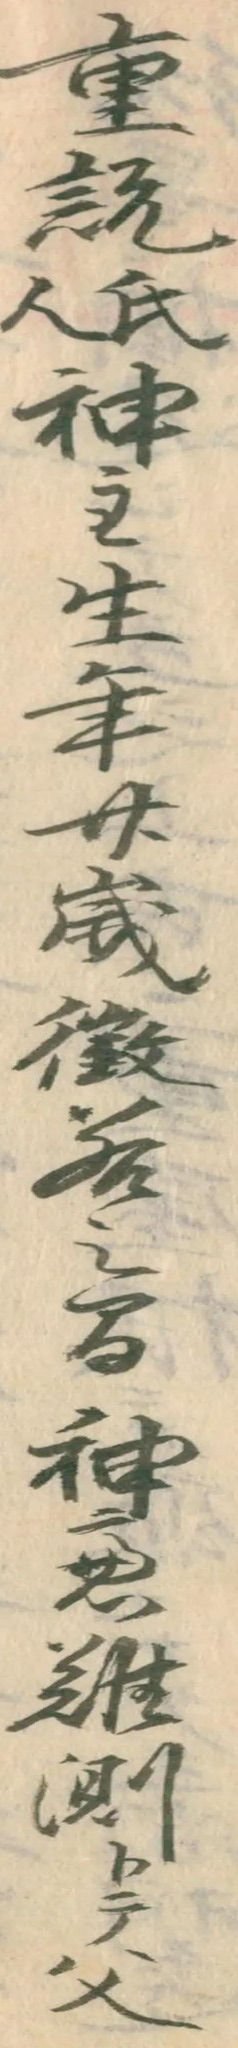重説氏人神主生年廿歳微若之間神慮難測トテ父
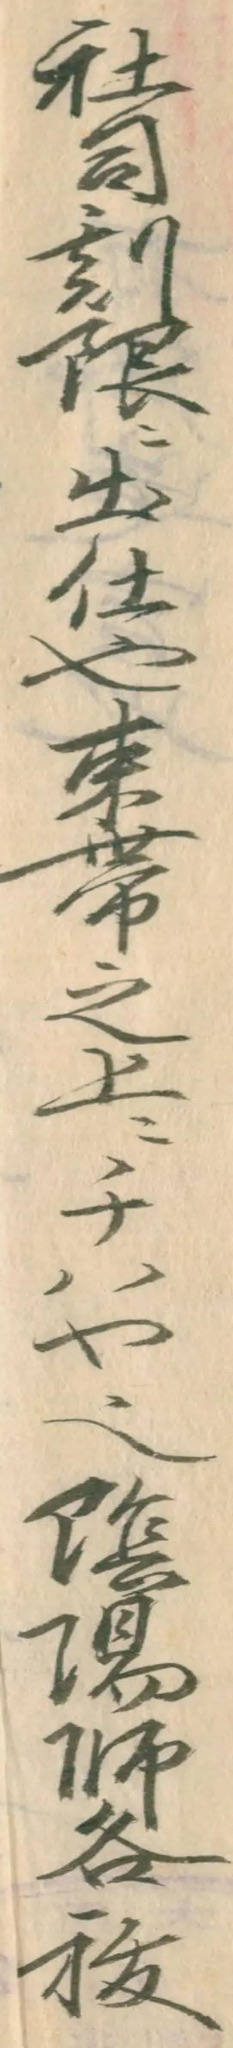一社司刻限ニ出仕也束帯之上ニチハヤ也陰陽師各祓
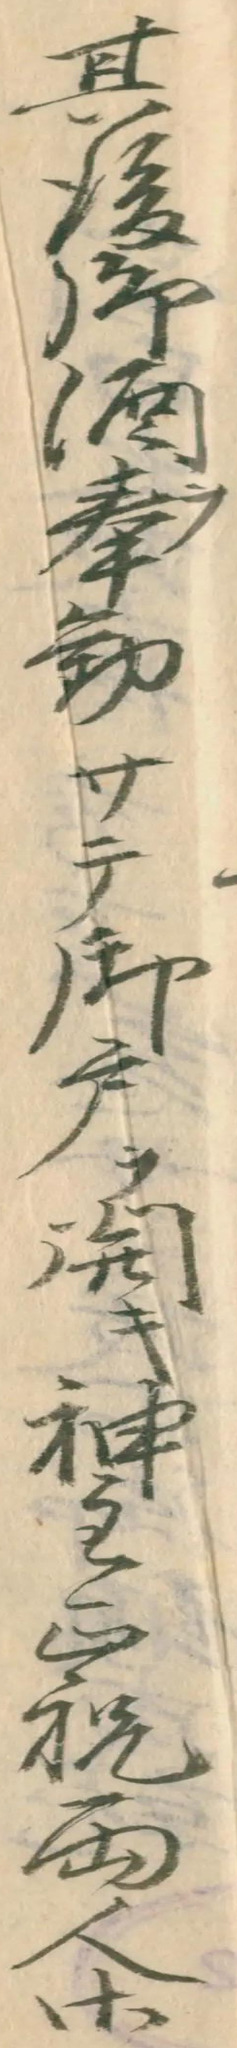其後御酒ヲ奉勤サテ御戸ヲ開キ神主正祝両人御
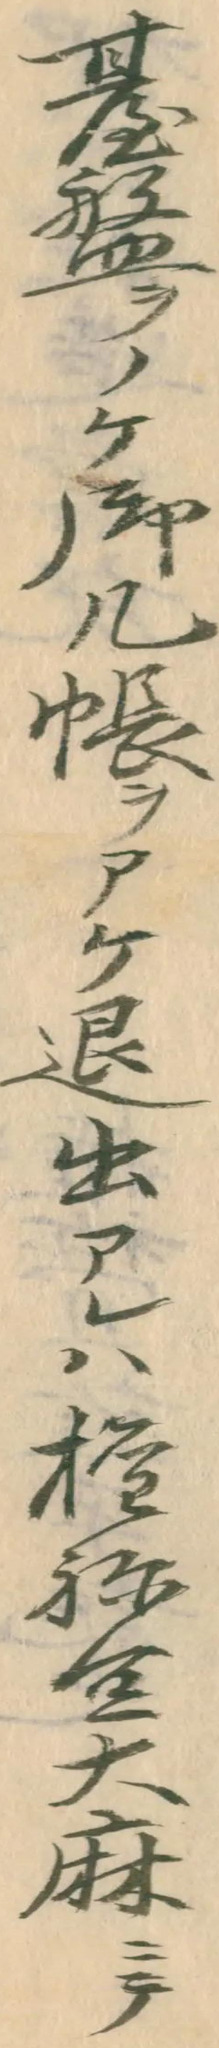台盤ヲノケ御几帳ヲアケ退出アレハ権祢宜大麻ニテ
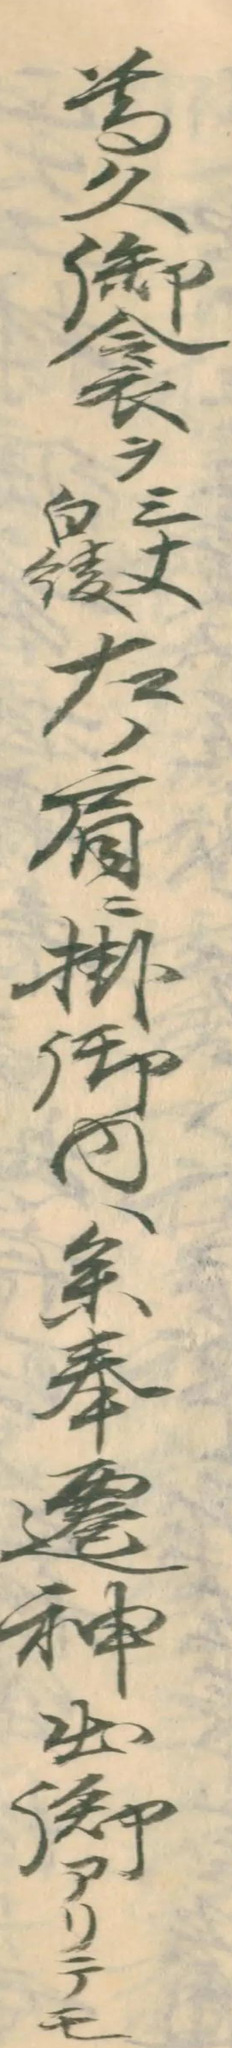一尊久御衾ヲ三丈白綾左ノ肩ニ掛御内へ参奉遷神出御アリテモ
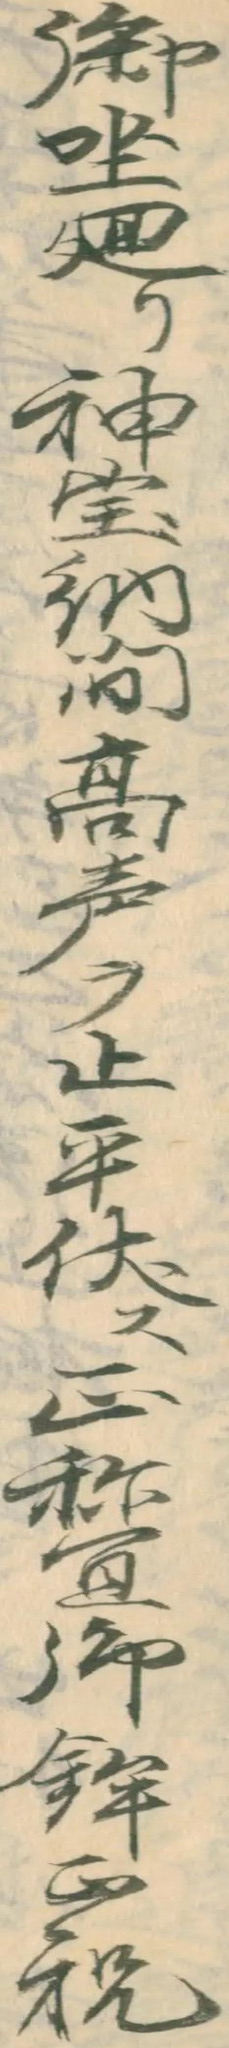御坐廻リ神宝納間高声ヲ止平伏ス正祢宜御鉾正祝
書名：賀茂社記録. 第15冊
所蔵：国立国会図書館 National Diet Library, JAPAN
